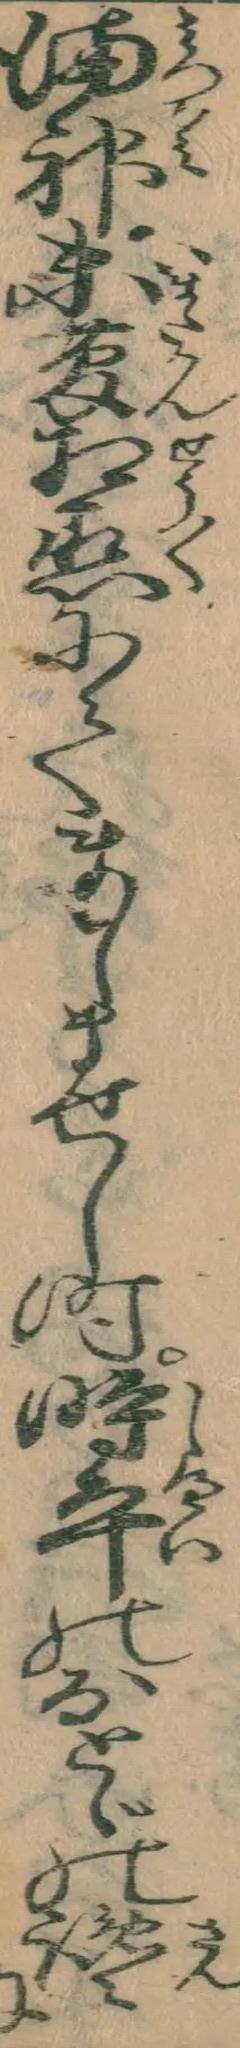満神未菅相丞にてましませし時。時平のおとゞの讒に
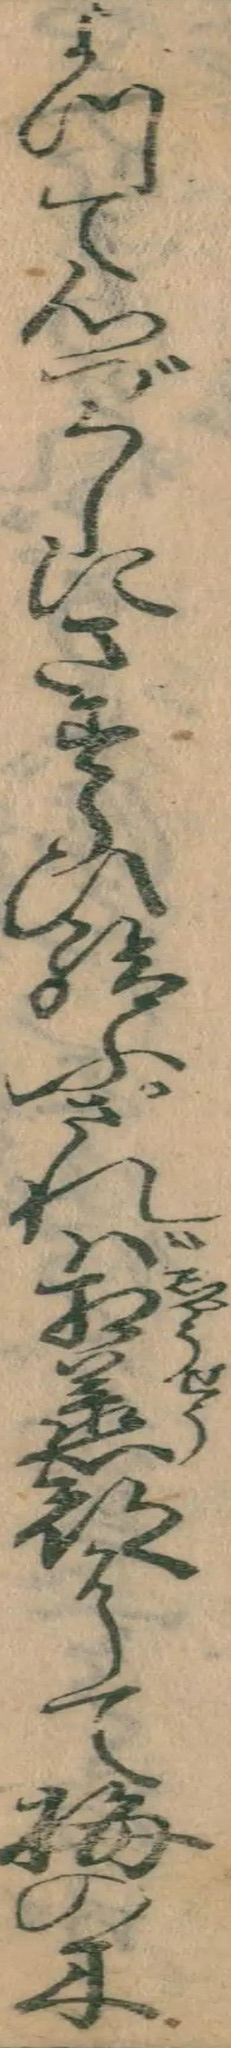よつて心づくしにさすらひ給ふ。されば相丞都にて梅の木
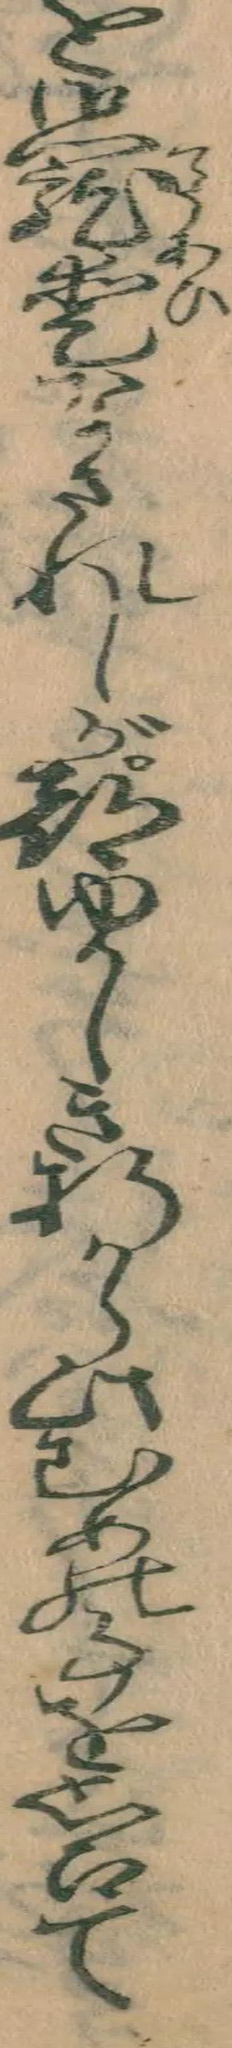を御寵愛なされしが。都ゆかしき折から此むめのを思召て
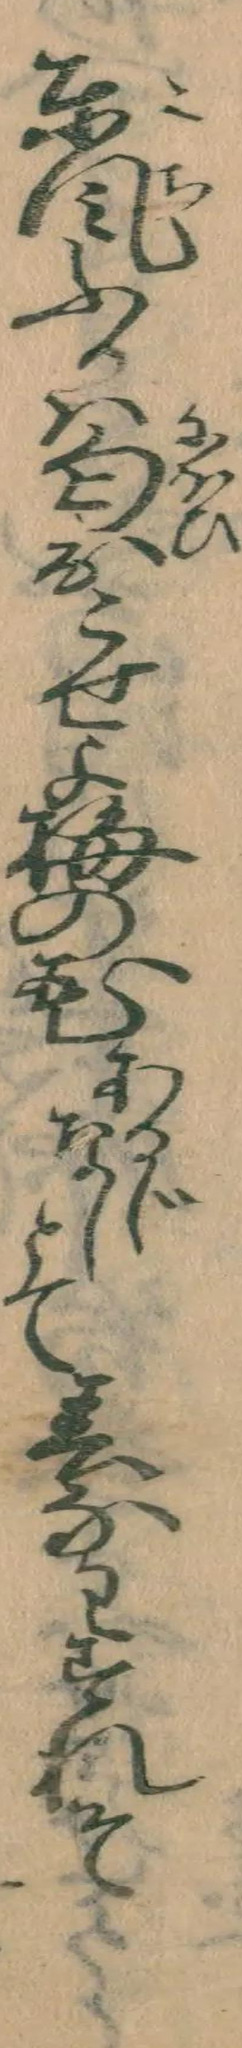東風ふかは匂おこせよ梅の花あるじなしとて春なわすれそ
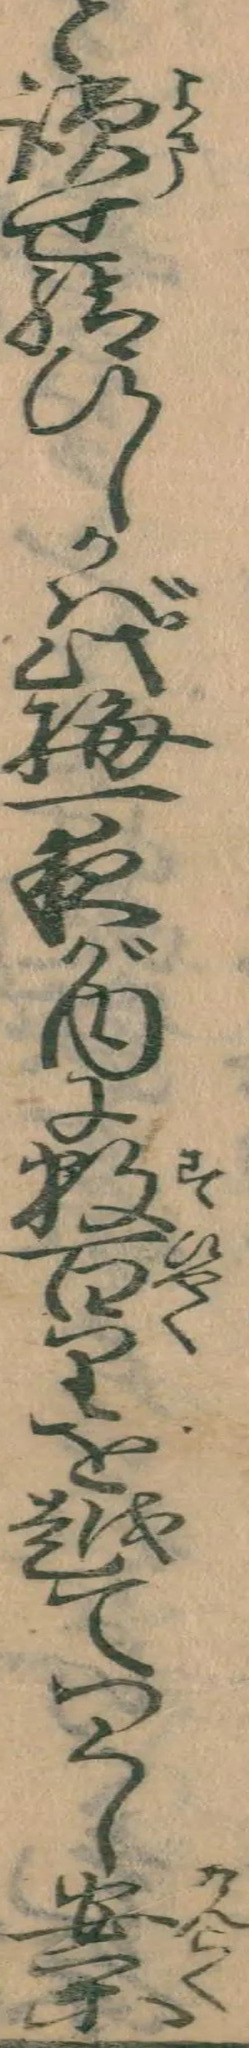と読せ給ひしかば。此梅一夜が内に数百里を越てつくし安楽
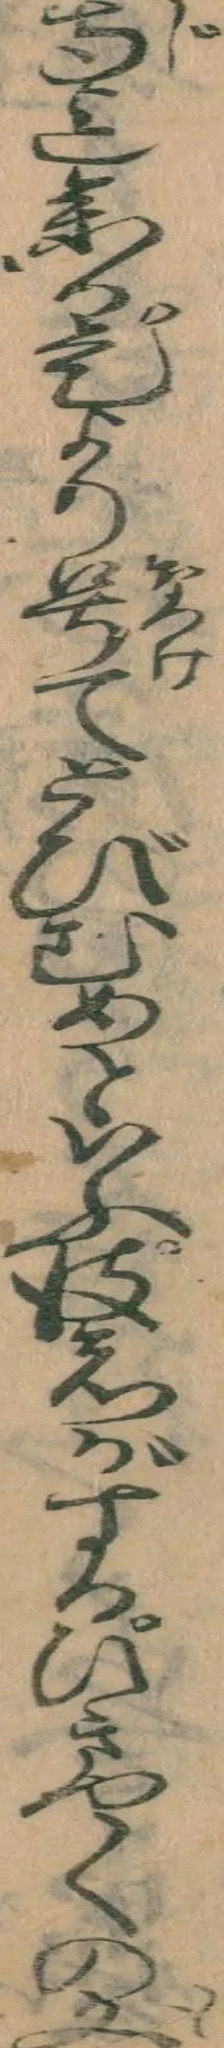寺迄参る。是より号てとびむめといふ。彼者がする。ひきや〱の文
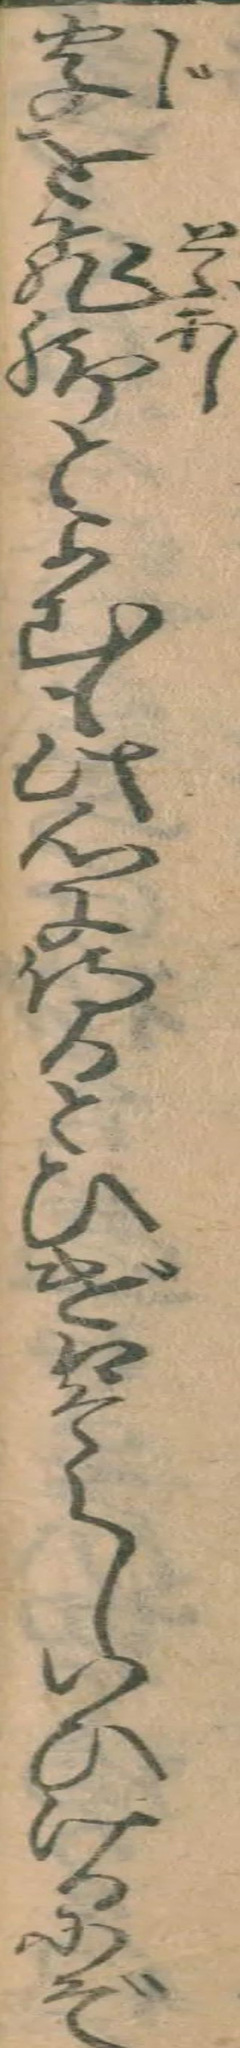字を飛脚とよむも此心に侍るとひげ口そらしいひけるにぞ
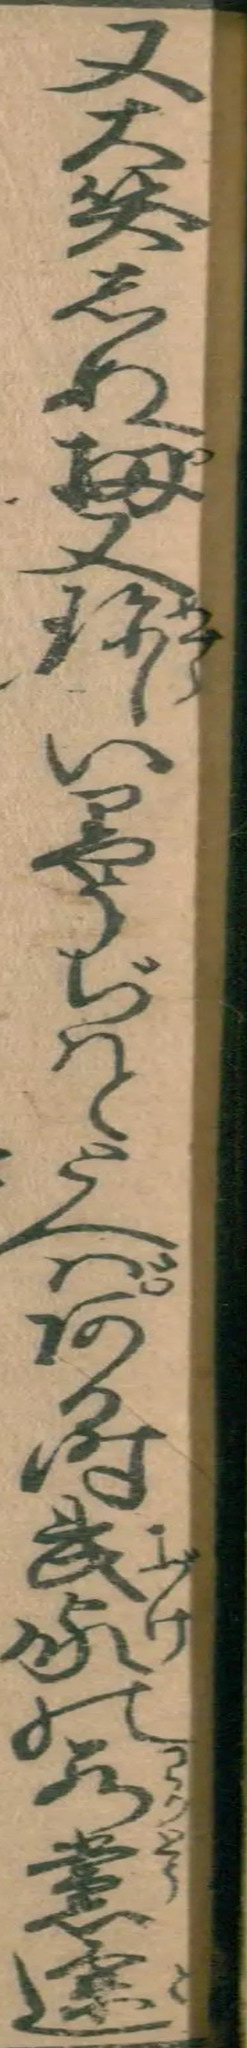又大笑しぬ。扨又珍しいりやうぢはととへば。ある時武家の若党途
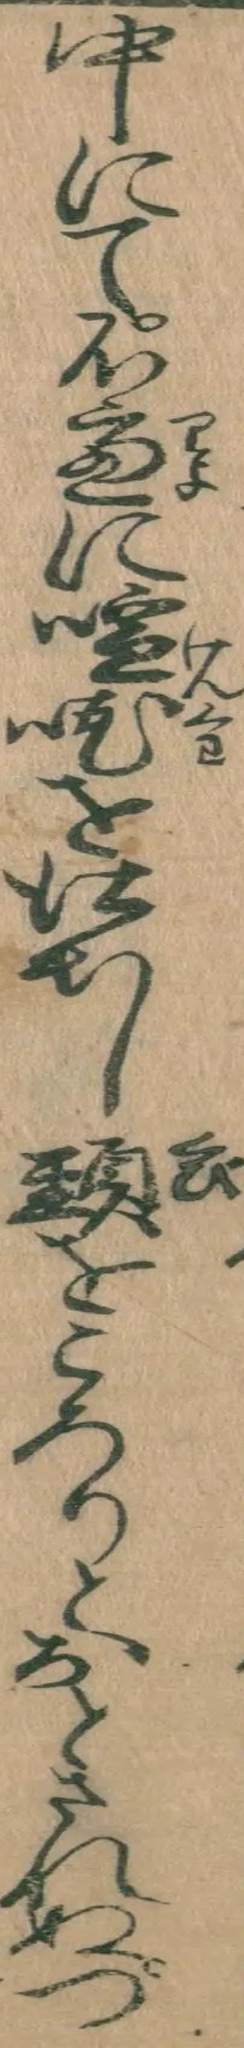中にて。不慮に喧嘩を仕出し頸をころりとおとされぬ。つ
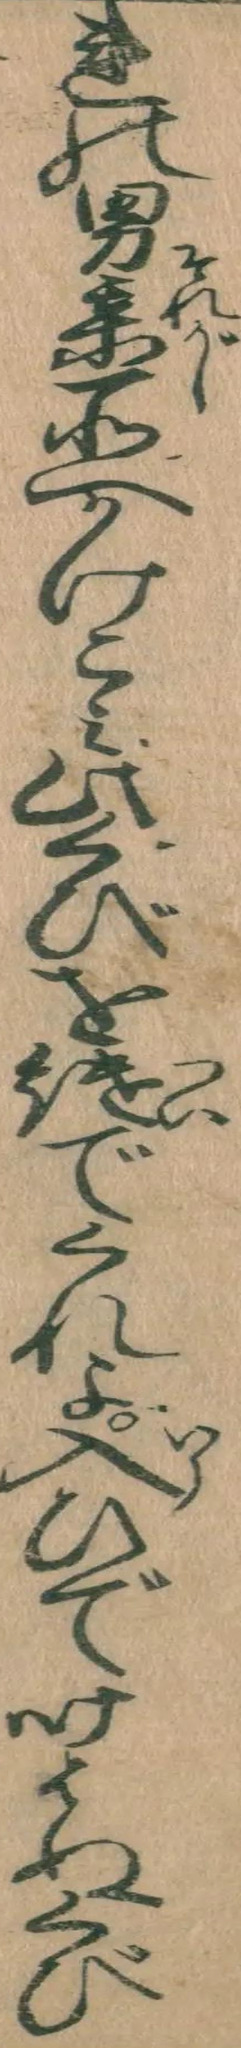れの男某所へかけこみ此くびを継でくれよ。入ひで叶わぬくび
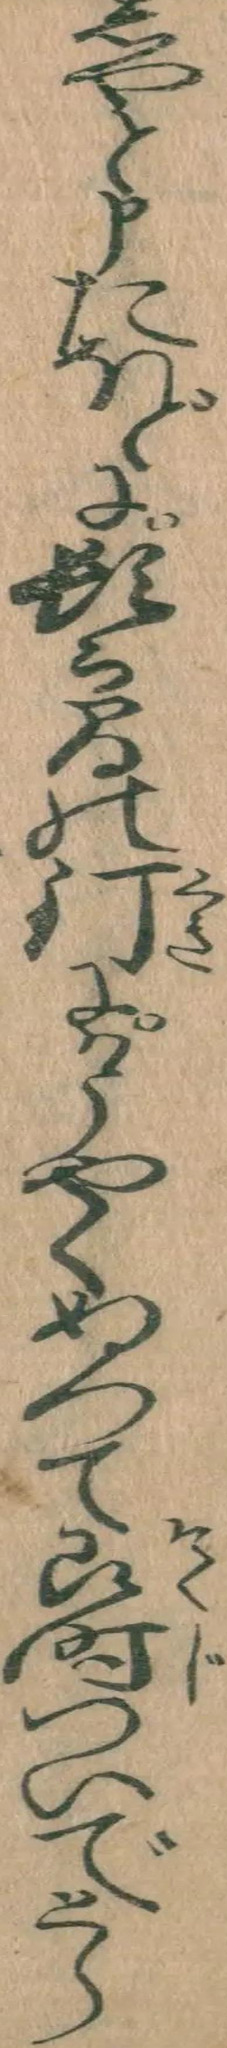しやと申たほどに。頓而間の釘に。かうやくぬつて即時ついでとら
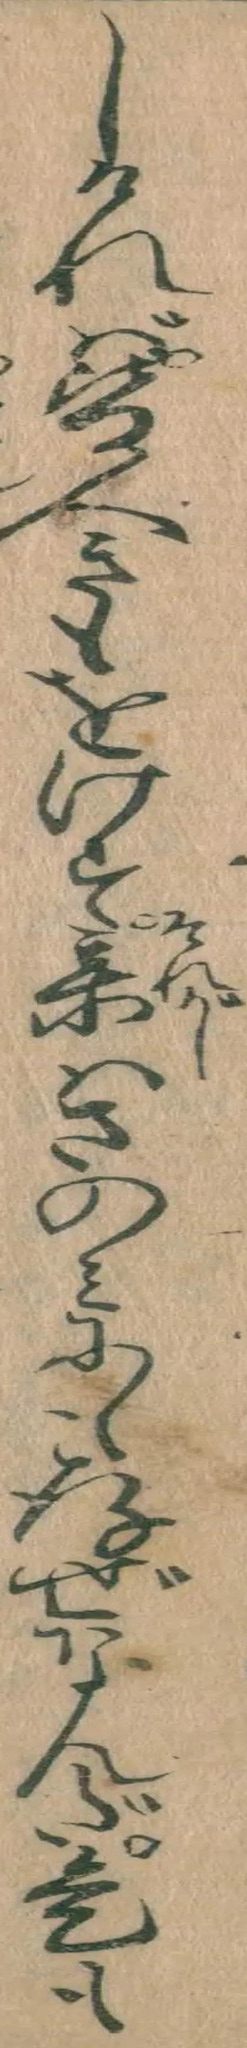しければ。皆人きもをけす。某はさのみにも存ぜなんだ。是も
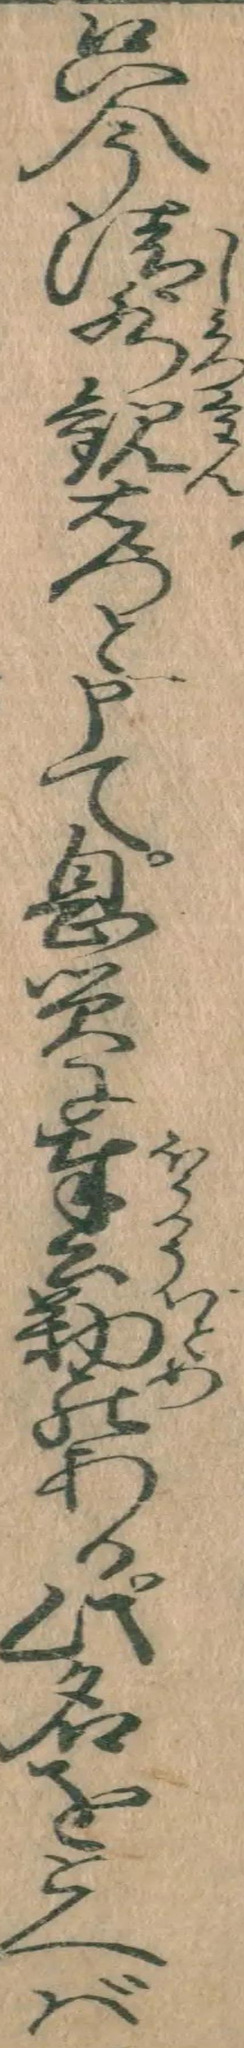只今清水観右衛門と申て。息災に奉公勤のある。此名をとへば
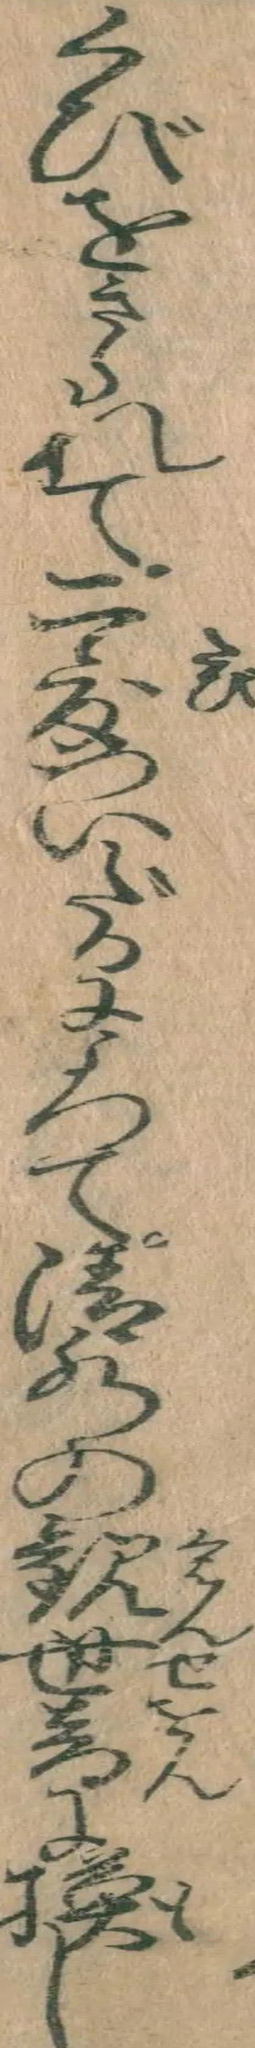くびをきられて二度ついだるによつて。清水の観世音に模し
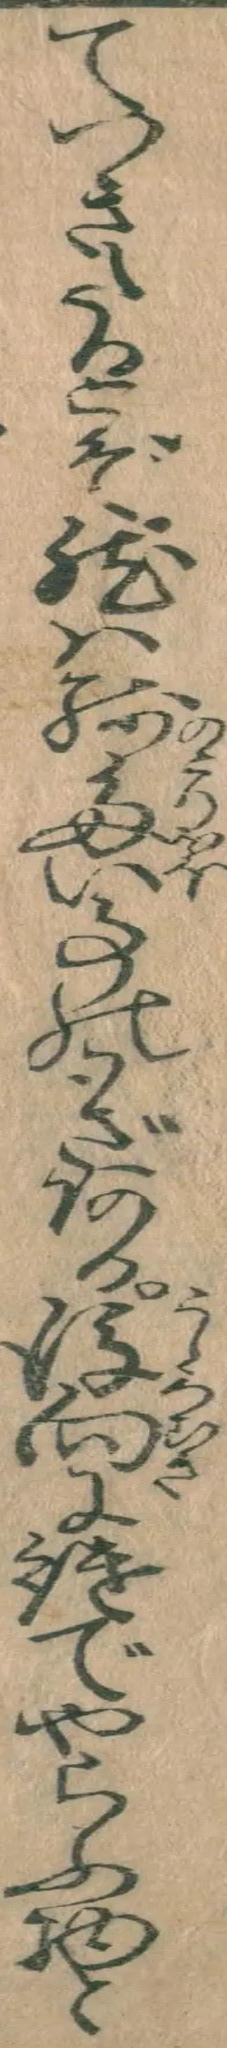てつきたるとぞ。然は残多い事の御ざある。後向に継でやらふ物と
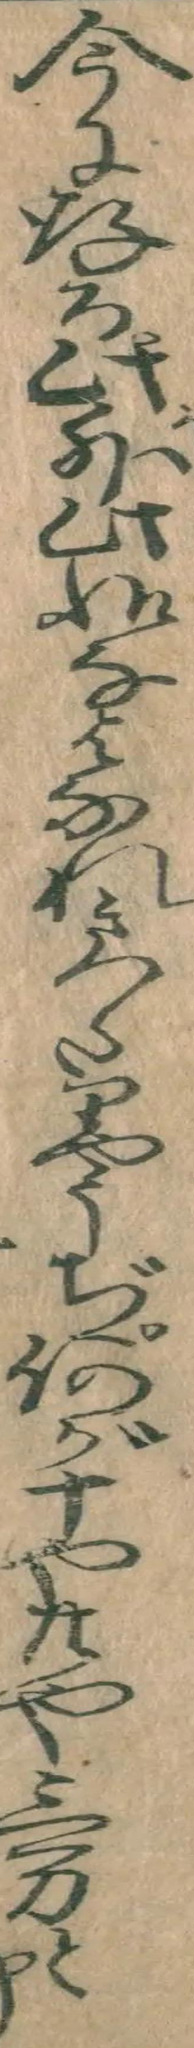今に存る。此外此様なはなれきつたりやうぢ。何が十や廿や三万と申
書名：新竹斎 5巻
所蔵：国立国会図書館 National Diet Library, JAPAN
